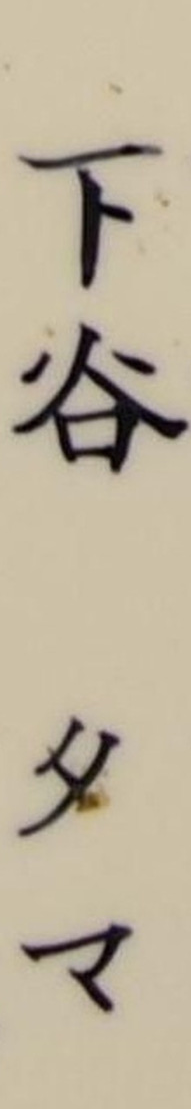下谷タマ
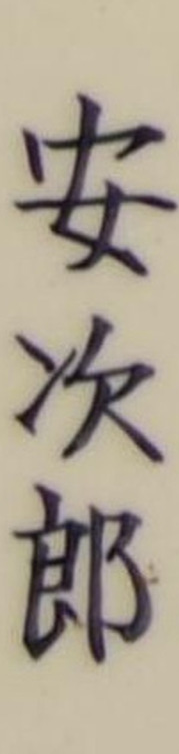安次郎
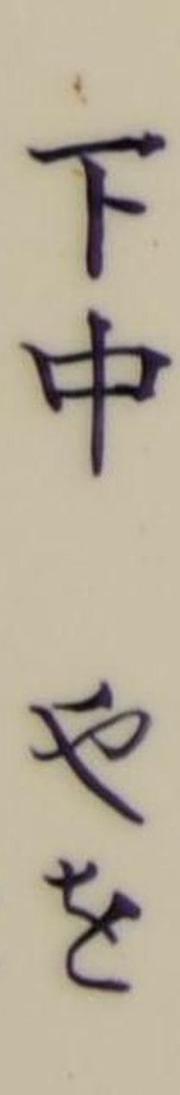下中やを
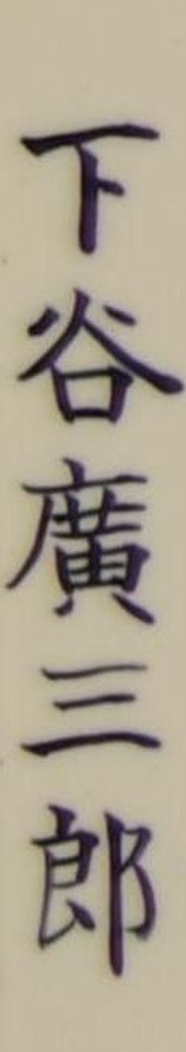下谷広三郎

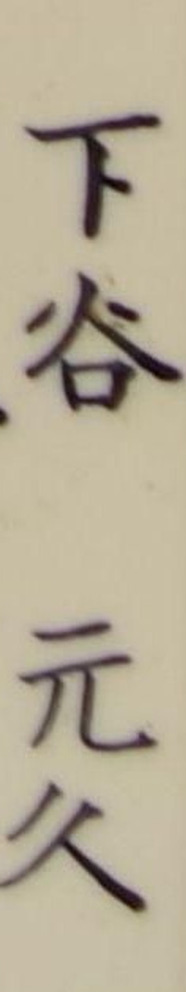下谷元久
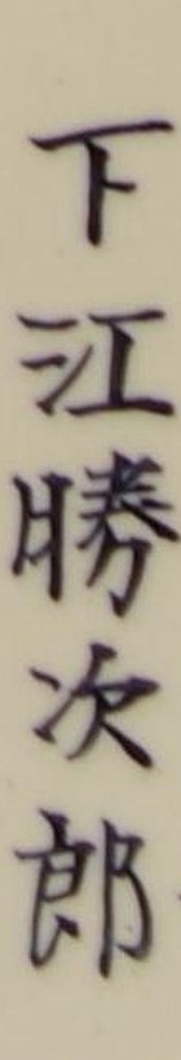下江勝次郎
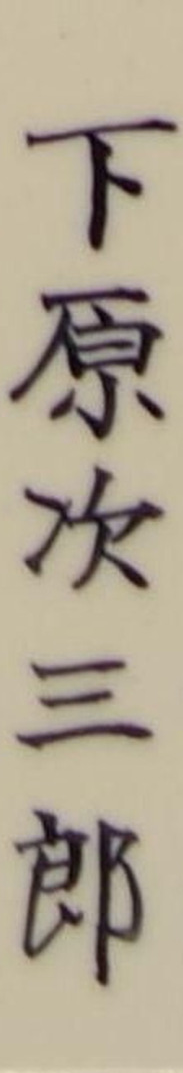下原次三郎
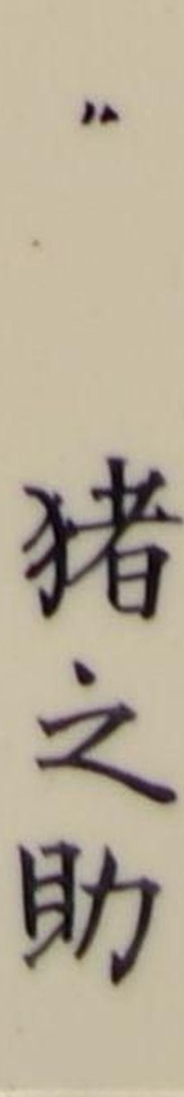猪之助
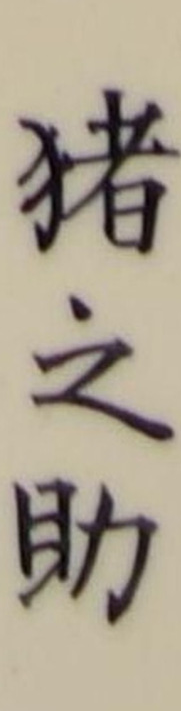猪之助
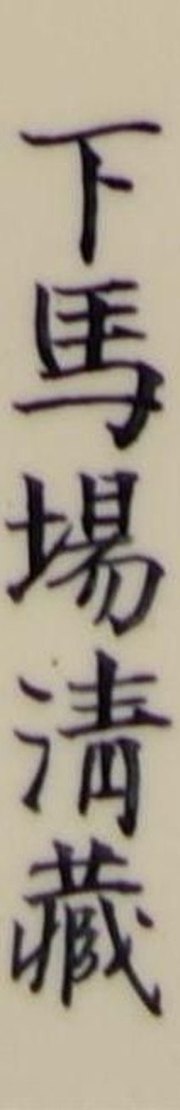下馬場清蔵
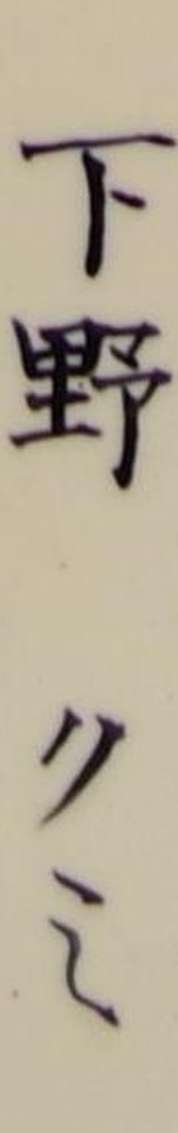下野クミ
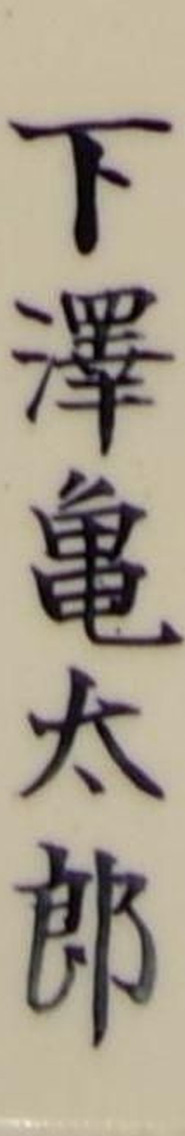下澤亀太郎
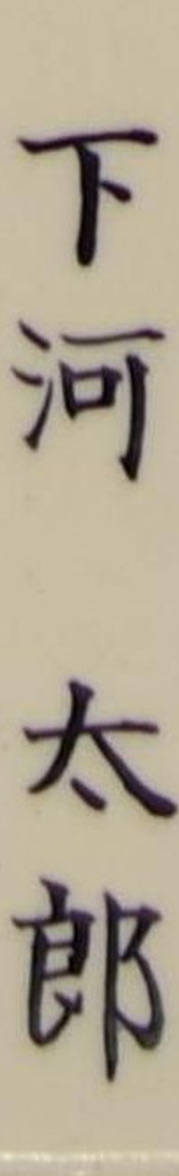下河太郎
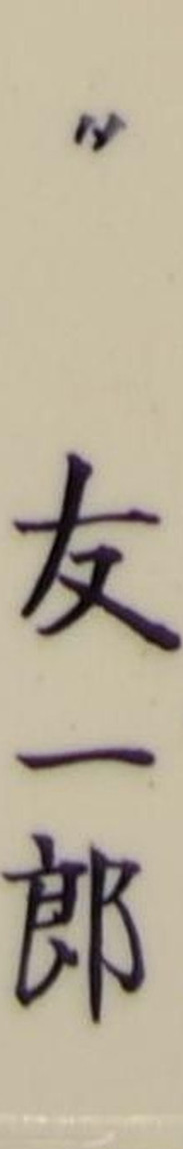友一郎
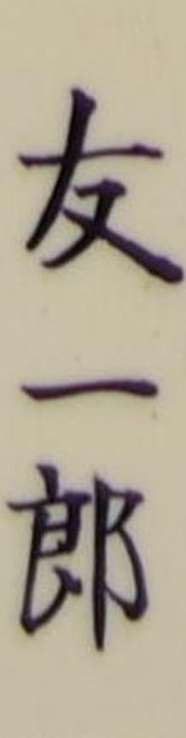友一郎
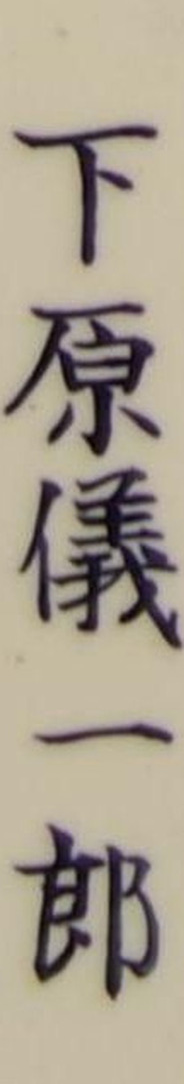下原儀一郎
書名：A~D
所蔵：koyasan kongobuji
